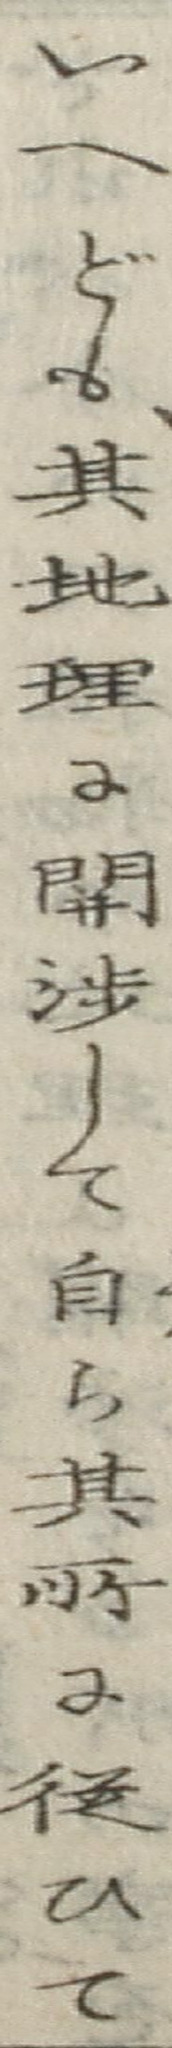いへども、其地理に関渉して自ら其所に従ひて
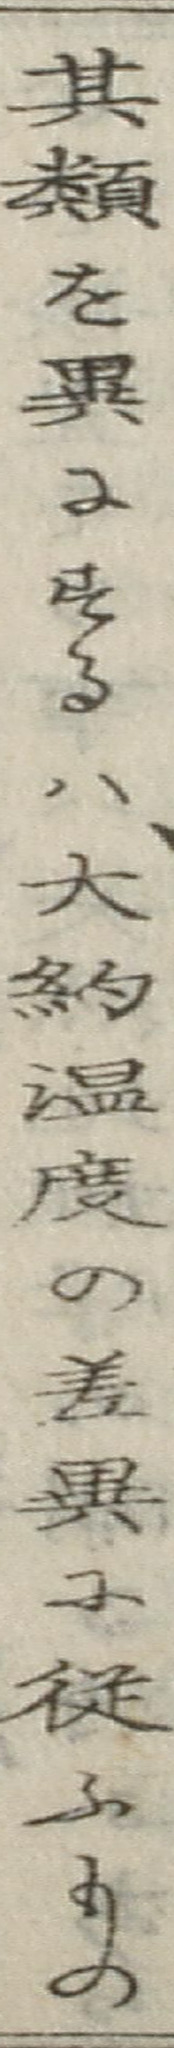其類を異にするは、大約温度の差異に従ふもの
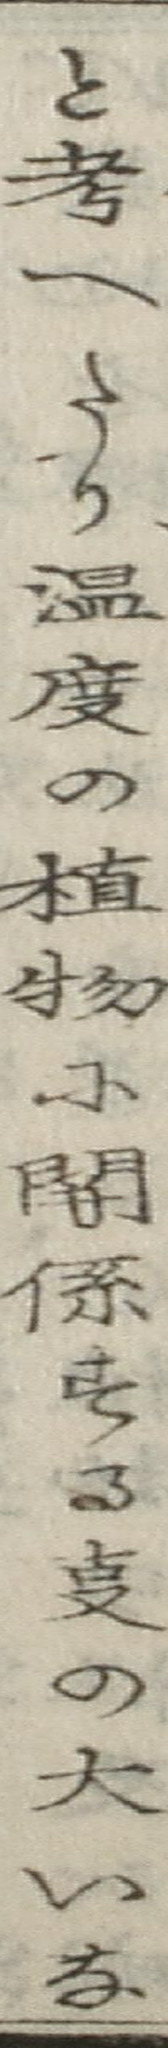と考へたり、温度の植物に関係する㕝の大いな
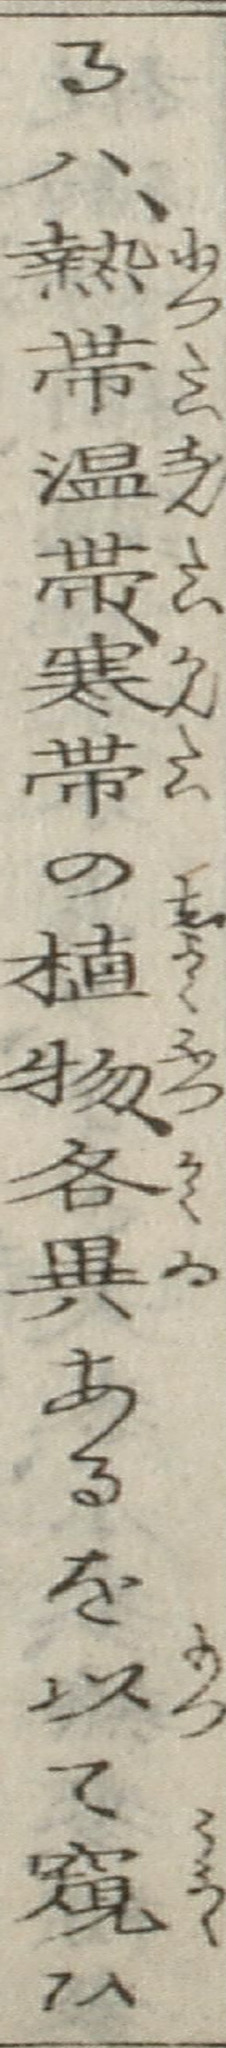るは、熱帯温帯、寒帯の植物、各異あるを以て窺ひ
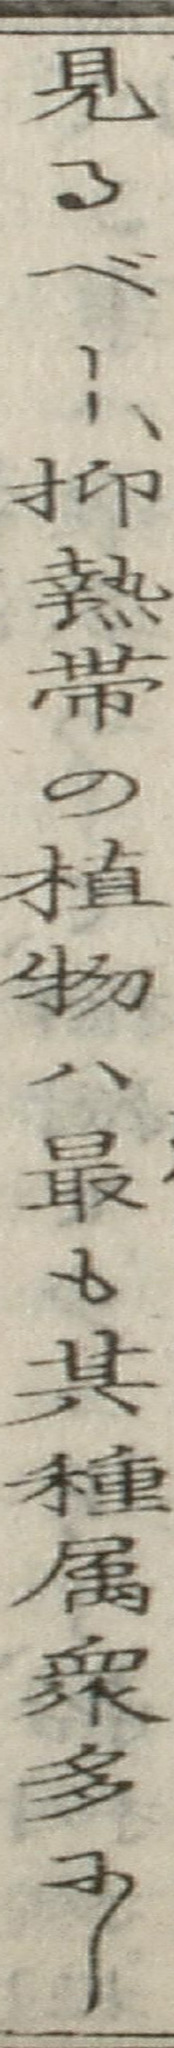見るべし、抑熱帯の植物は最も其種属衆多にし
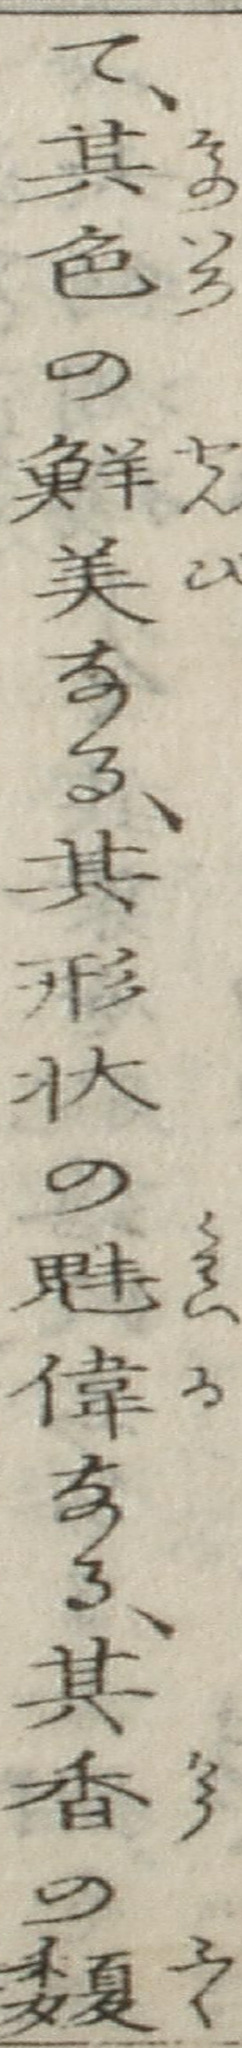て、其色の鮮美なる、其形状の魅偉なる、其香の馥
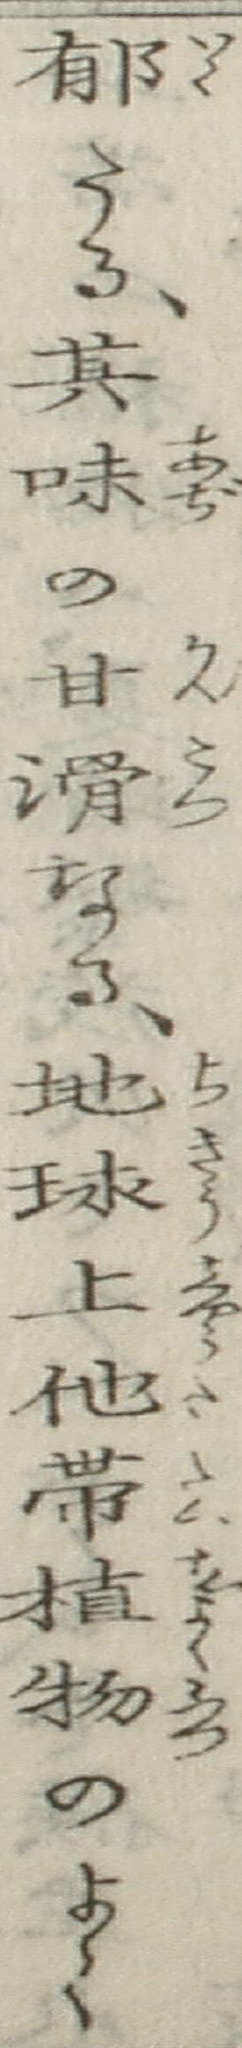郁たる、其味の甘滑なる、地球上他帯植物のよく
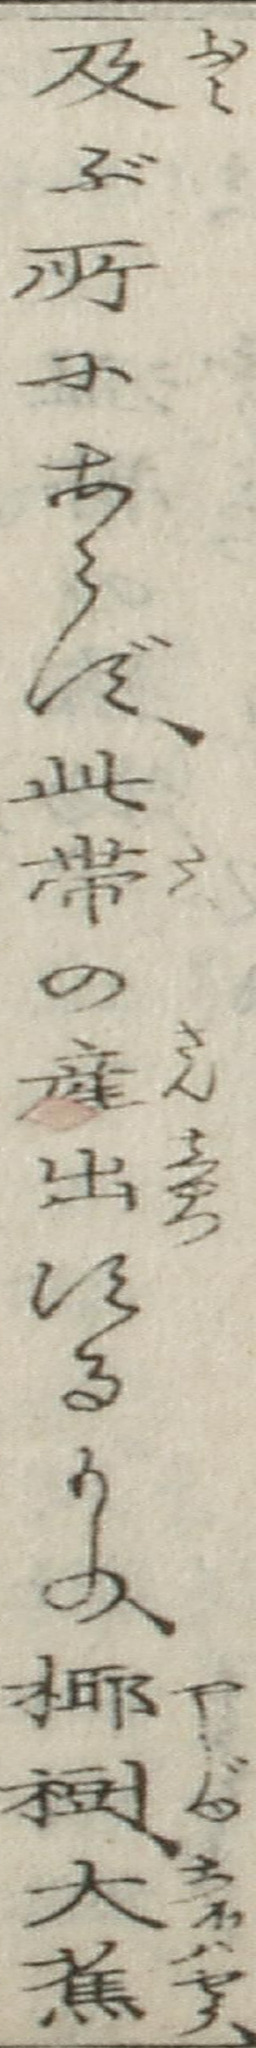及ぶ所にあらず、此帯の産出するもの、椰樹、大蕉、
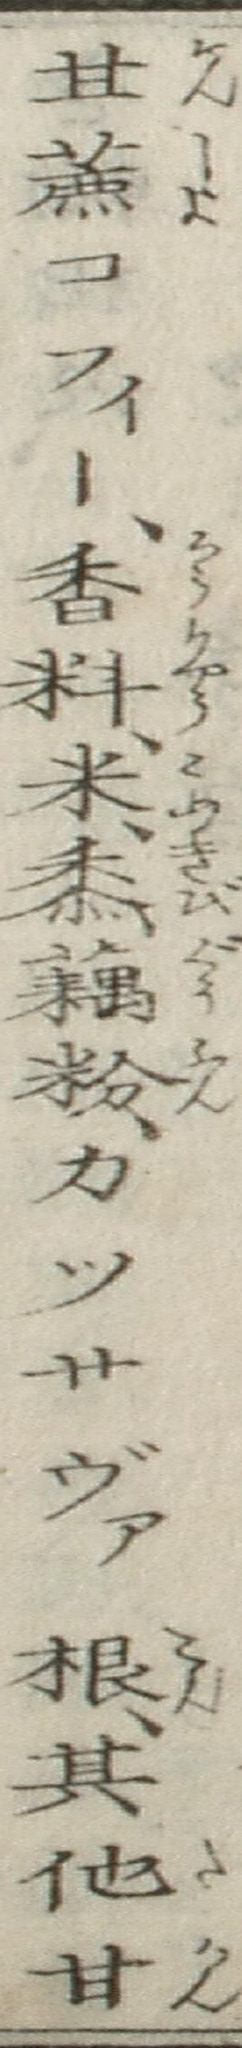甘蔗、コフィー、香料、米、黍、藕粉、カツサヴァ根、其他甘
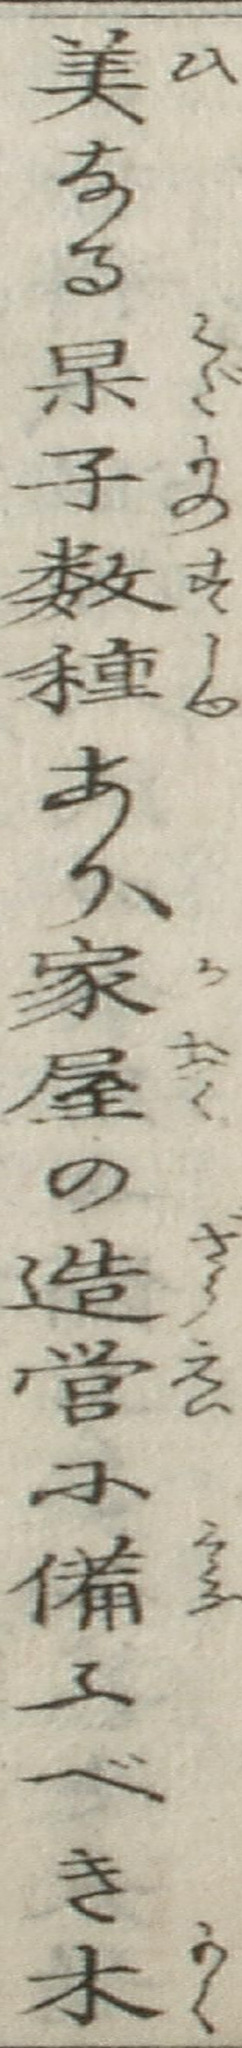美なる果子数種あり、家屋の造営に備ふべき木
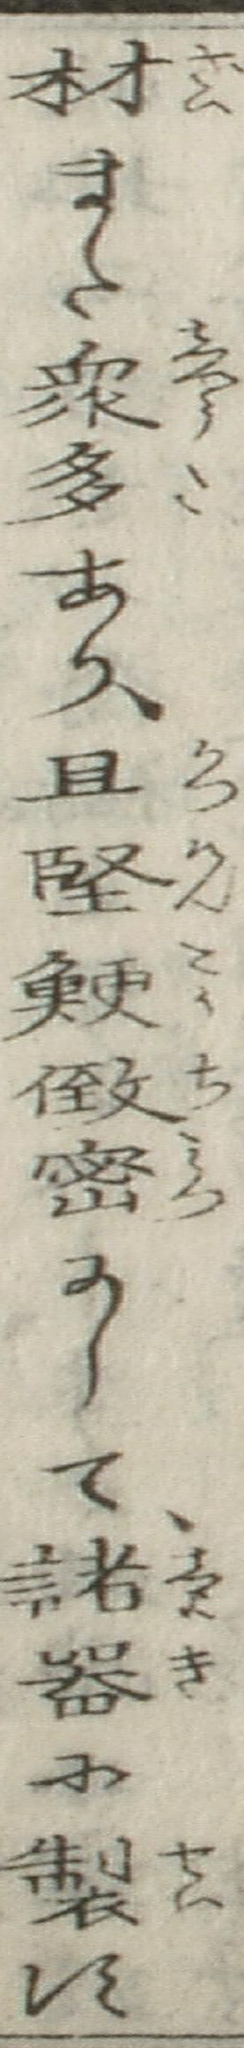材また衆多あり、且堅硬緻密にして、諸器に製す
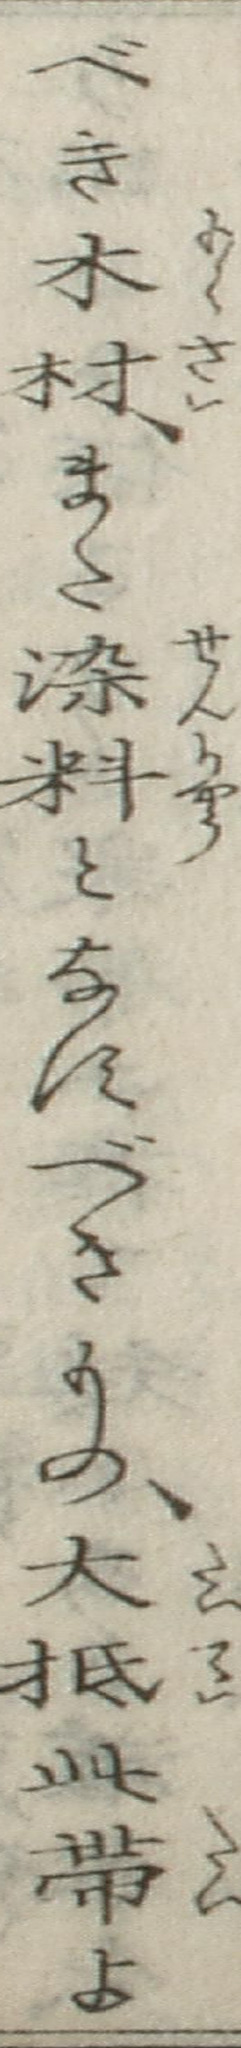べき木材、また染料となすべきもの、大抵此帯よ

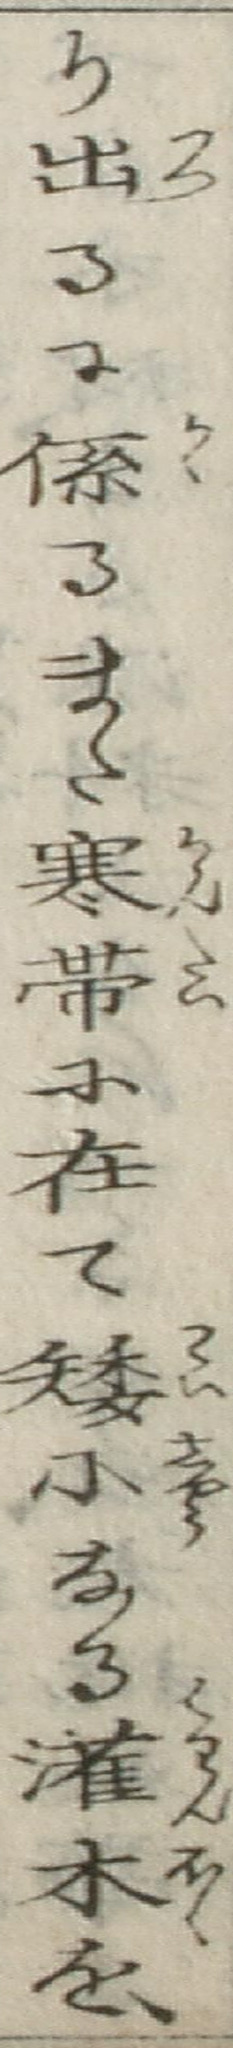り出るに係るまた寒帯に在て矮小なる灌木を、
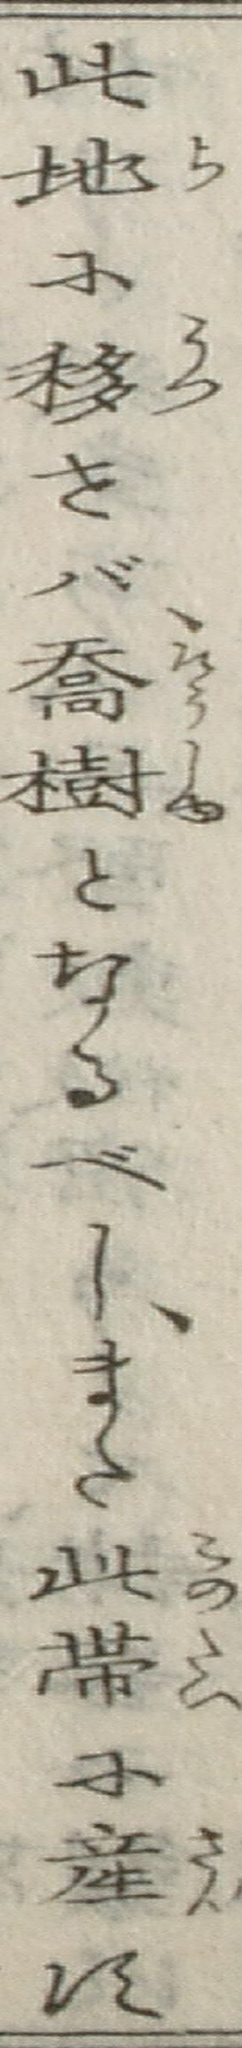此地に移さば、喬樹となるべし、また此帯に産す
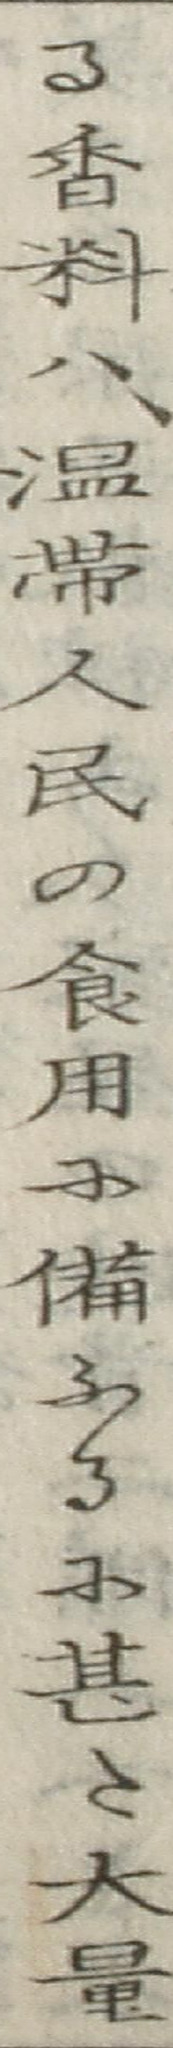る香料は、温帯人民の食用に備ふるに甚た大量
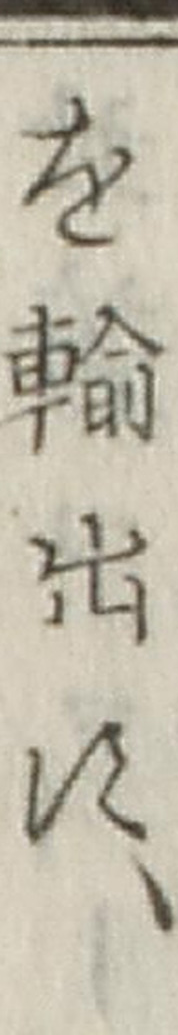を輸出す、
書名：訓蒙　天然地理學　下
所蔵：東京大学地震研究所図書室 Earthquake Research Institute Library, The University of Tokyo, JAPAN
